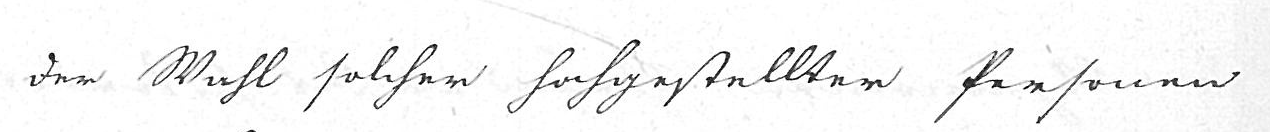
der Wahl solcher hochgestellter Personen
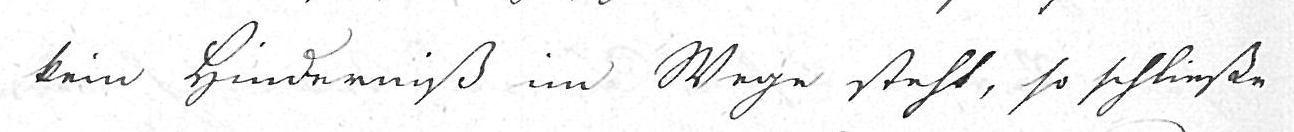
kein Hinderniß im Wege steht, so schließe
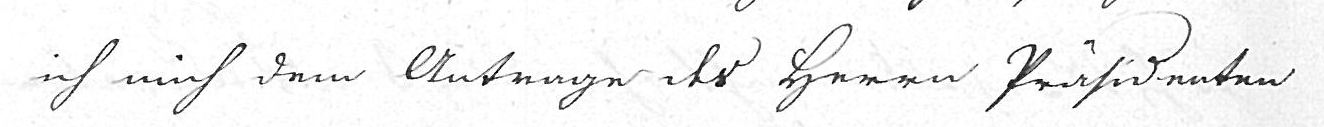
ich mich dem Antrage des Herrn Präsidenten
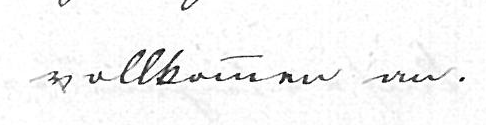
vollkommen an.
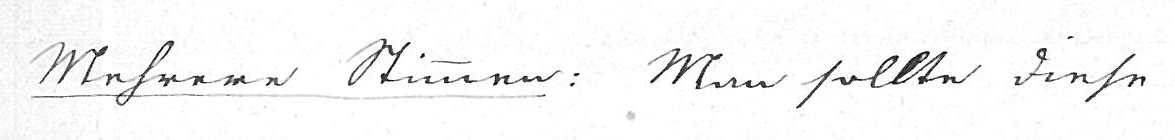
Mehrere Stimmen: Man sollte diese
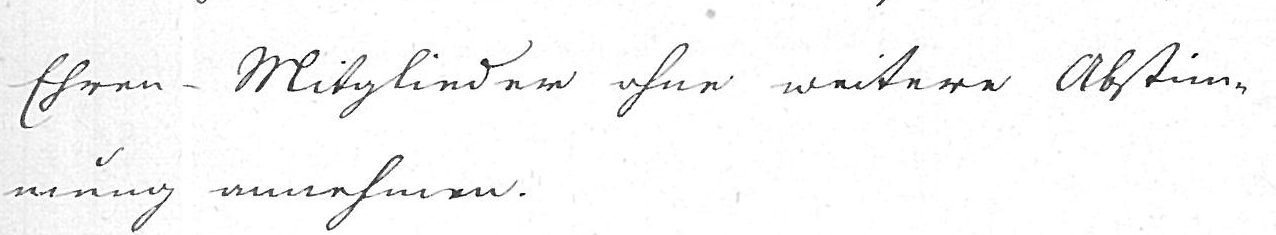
Ehren-Mitglieder ohne weitere Abstim-
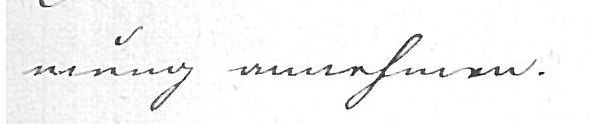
mung annehmen.
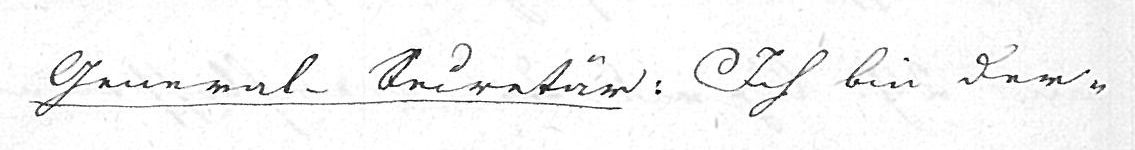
General-Secretär: Ich bin der-
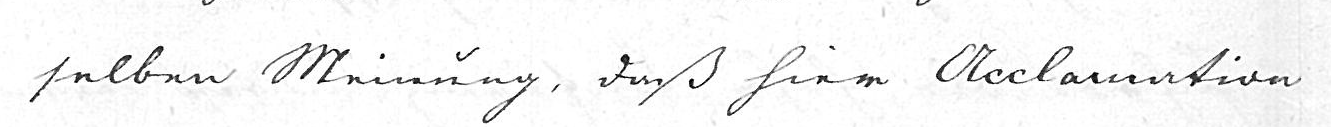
selben Meinung, daß hier Acclamation
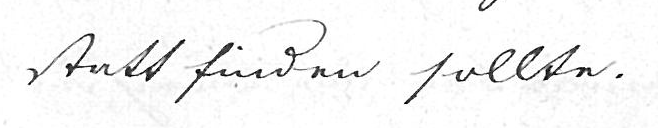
statt finden sollte.
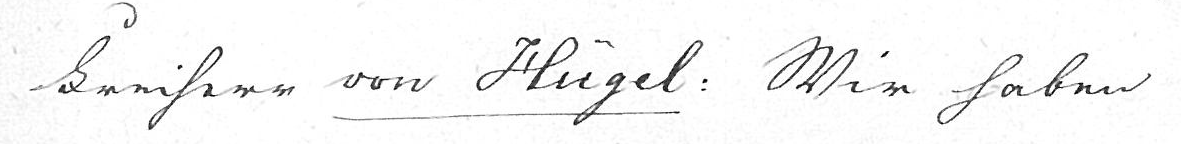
Freiherr von Hügel: Wir haben
